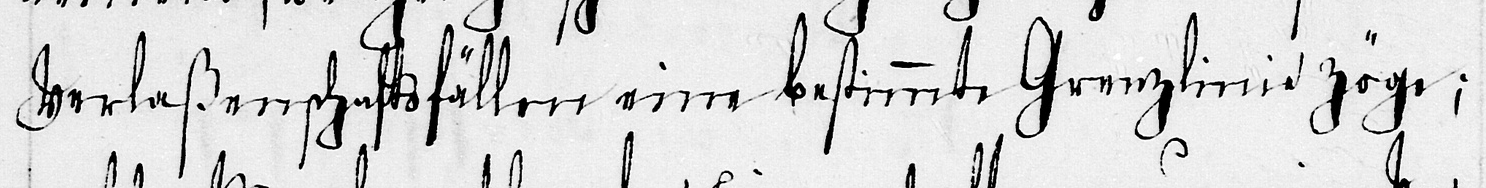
Verlaßenschaftsfällen eine bestimmte Grenzlinie zöge;
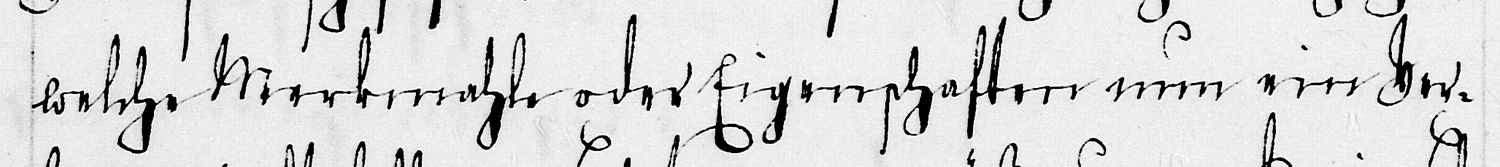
welche Merkmahle oder Eigenschaften nun ein Ver¬
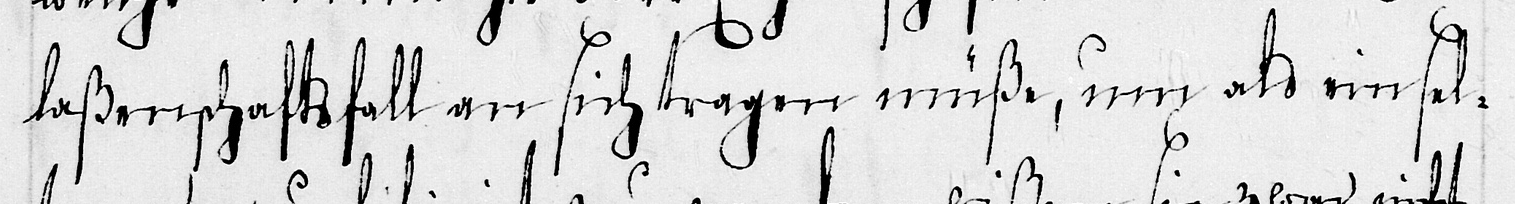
laßenschaftsfall an sich tragen müße, um als ein sel¬
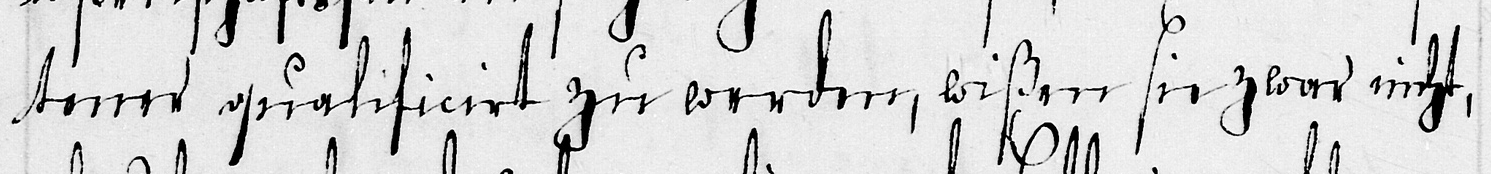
tener qualificirt zu werden, wißen sie zwar nicht,
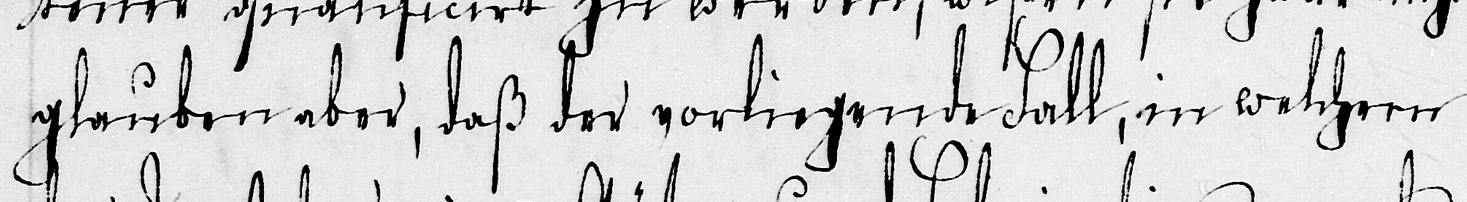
glauben aber, daß der vorliegende Fall, in welchem
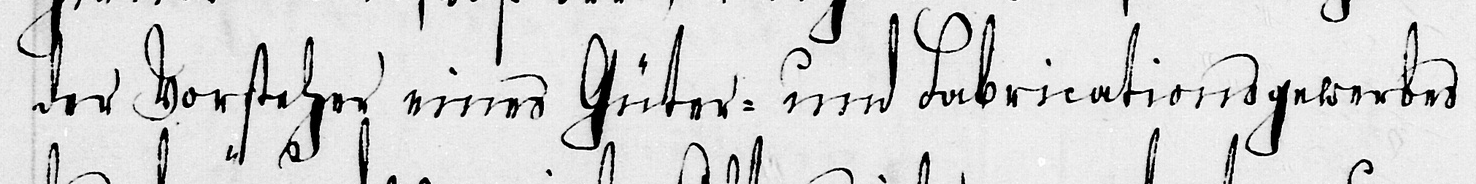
der Vorsteher eines Güter- und Fabricationsgewerbes
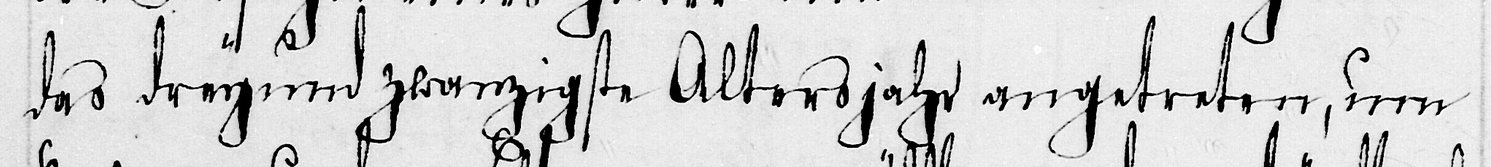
das dreyundzwanzigste Altersjahr angetreten, um
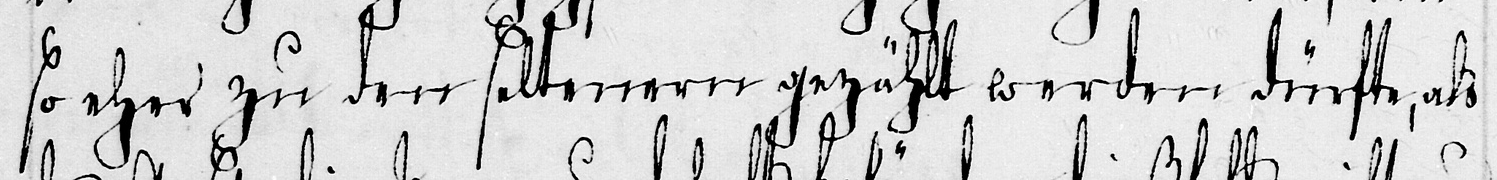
so eher zu den seltenern gezählt werden dürfte, als
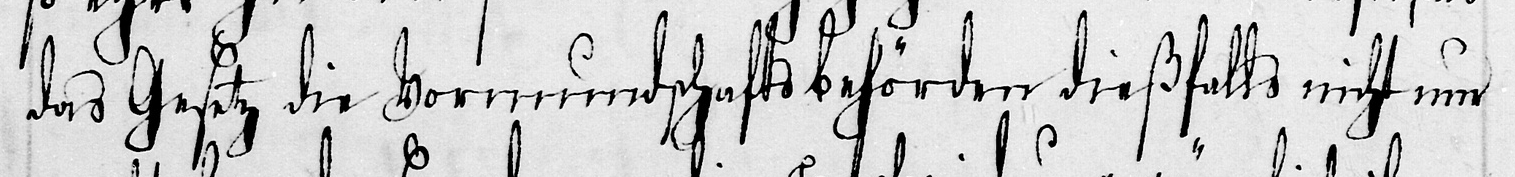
das Gesetz die Vormundschaftsbehörden dießfalls nicht nur
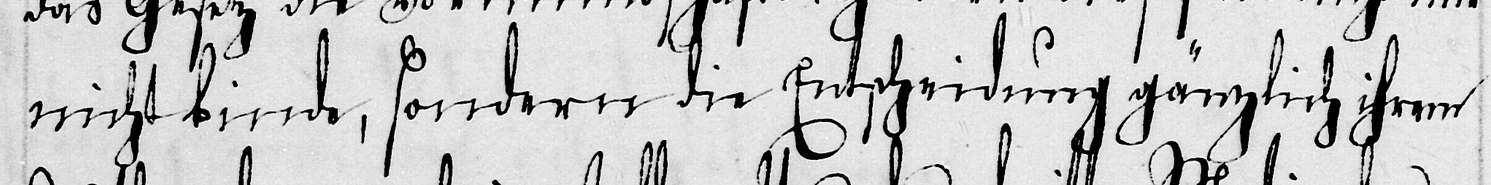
nicht binde, sondern die Entscheidung gänzlich ihrem
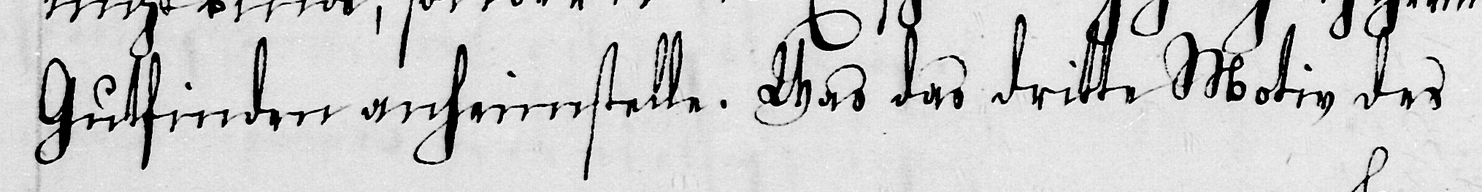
Gutfinden anheimstelle. Was das dritte Motiv des
